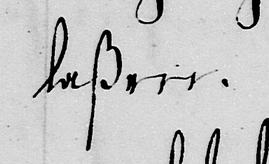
laßen.
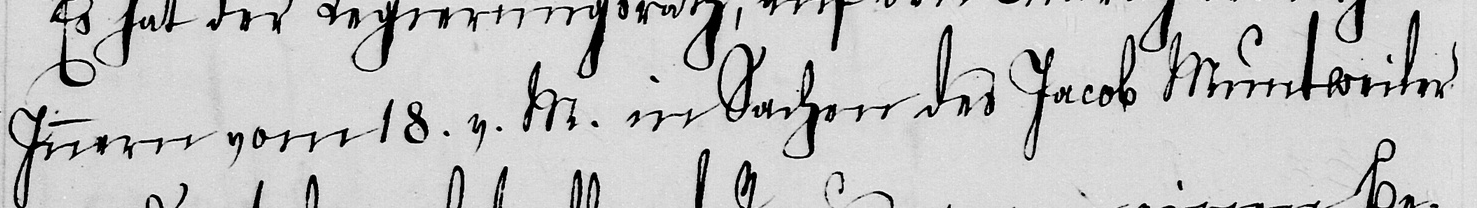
Innern vom 18. v. M. in Sachen des Jacob Muntweiler
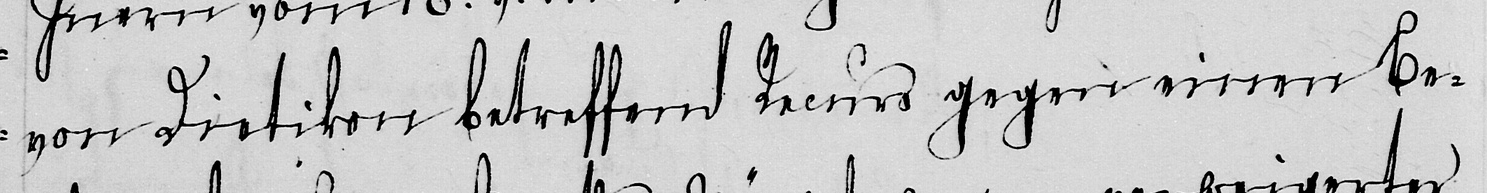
von Dietikon betreffend Recurs gegen einen Be¬
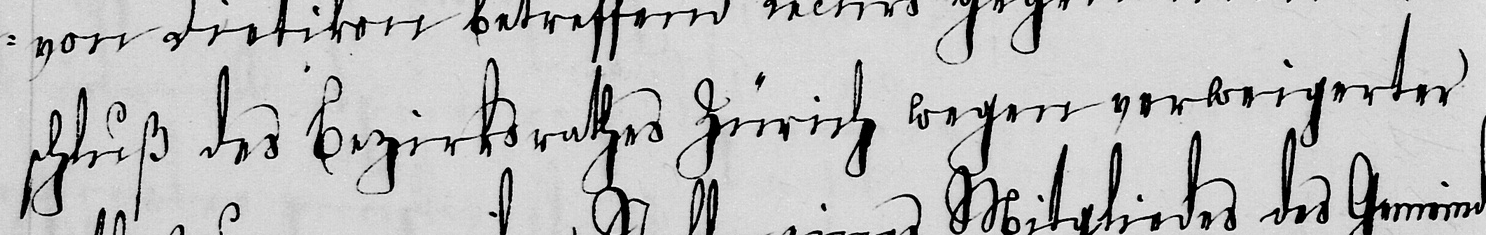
schluß des Bezirksrathes Zürich wegen verweigerter
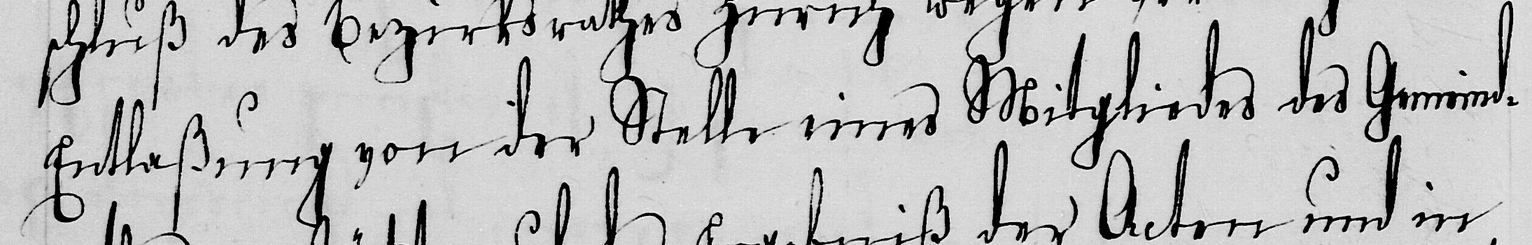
Entlaßung von der Stelle eines Mitgliedes des Gemein¬
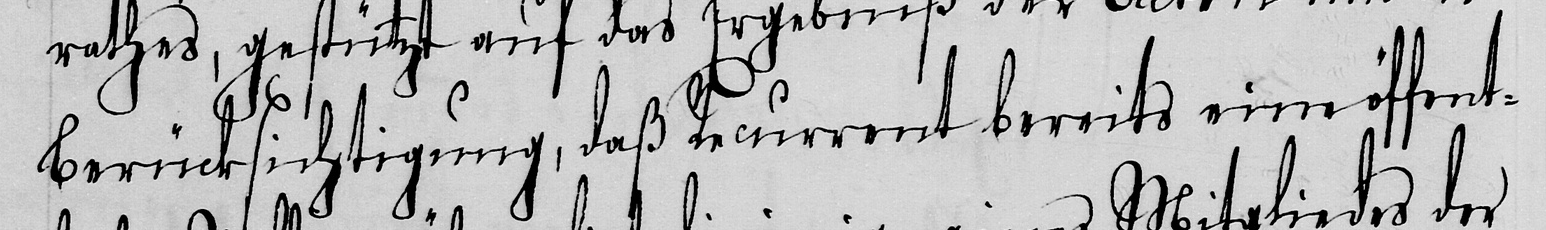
Berücksichtigung, daß Recurrent bereits eine öffent¬
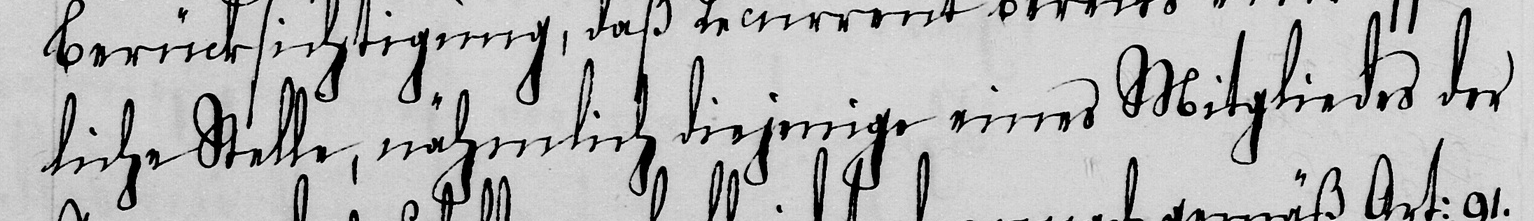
liche Stelle, nähmlich diejenige eines Mitgliedes der
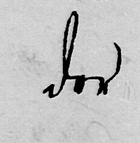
des
